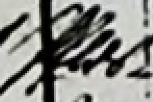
Pflds
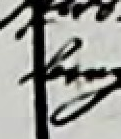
berg
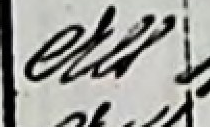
Alt
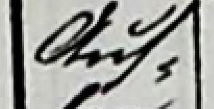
Auf„
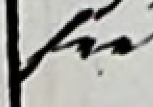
see
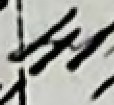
41
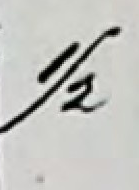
1/2
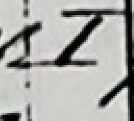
I
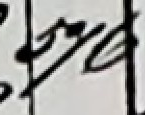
576
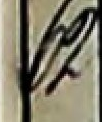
62
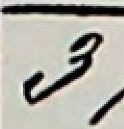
3
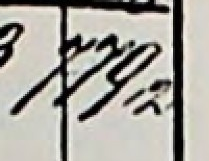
779,2
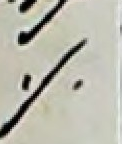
./.
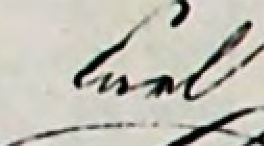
Carl
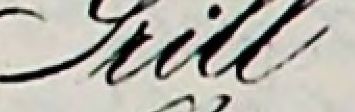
Grill
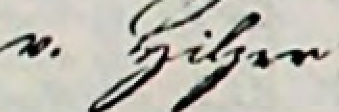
v. Hilzer
